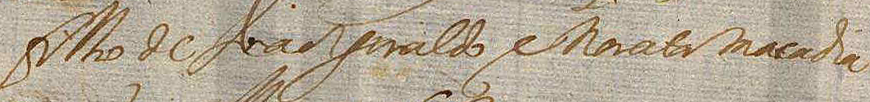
filho de Joaõ giraldo e Norata macadia
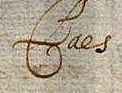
Paes
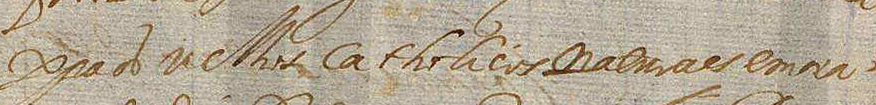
xpaõs uelhos catholicos naturaes e mora
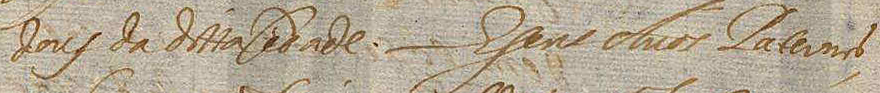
dores da ditta Cidade. - E seus Auos Paternos,
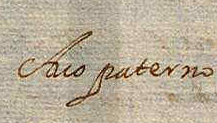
Auo paterno
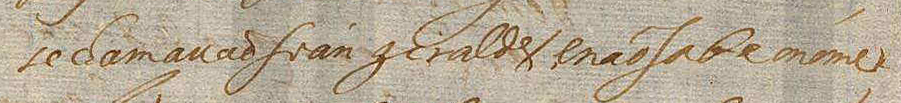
se chamauaõ Joan giraldes E naõ sabe o nome
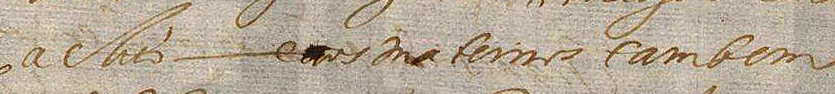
a Auó - e aos maternos tambem
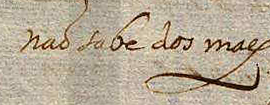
naõ sabe dos maes
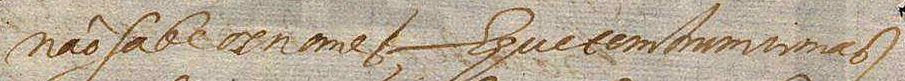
naõ sabe os nomes - E que tem hum irmaõ
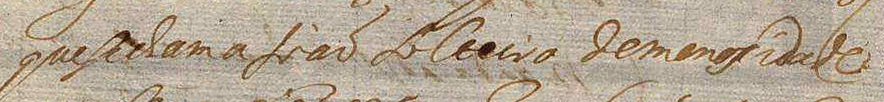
que se chama Joaõ solteiro de menos idade
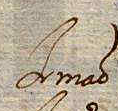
Irmaõ
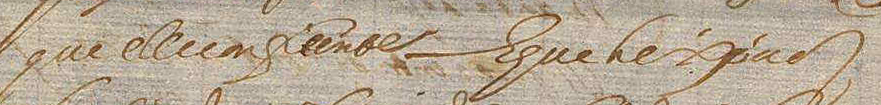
que elle confitente - E que he xpão
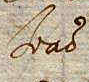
Ioaõ
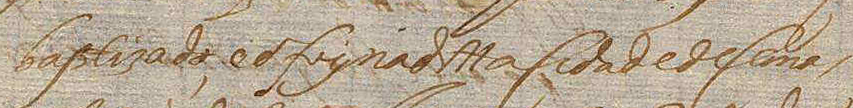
baptizado, e o foy na ditta Cidade de Canas
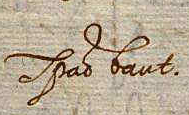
Xpaõ baut.
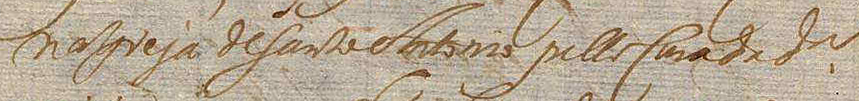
na Jgreja de santo Antonio pello Cura da da.
